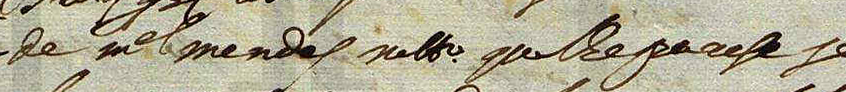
de mel mendes netto. que lhe parese se
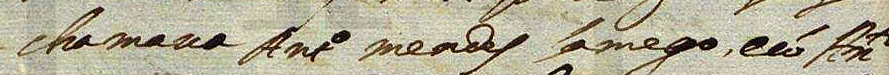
chamaua Anto mendes Lamego, e cō Anto
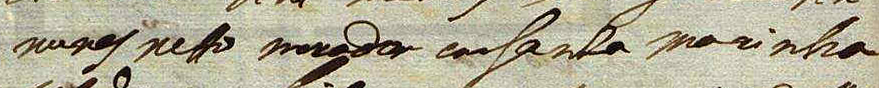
nunes netto morador em santa marinha
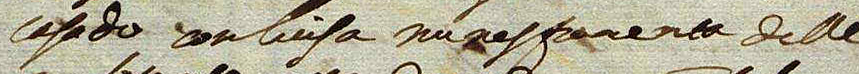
casado com luisa nunes parenta delle
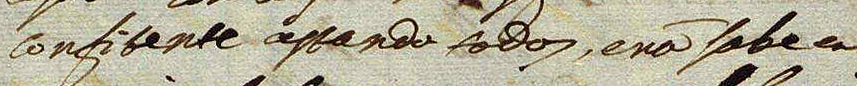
confitente estando todos, e naõ sabe em
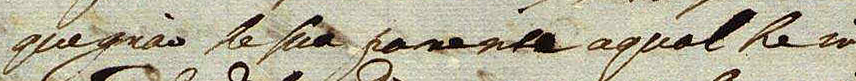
que grao de sua parente a qual he ir
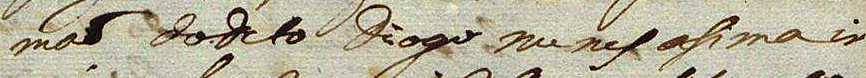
mã do dito Diogo nunes asima ir
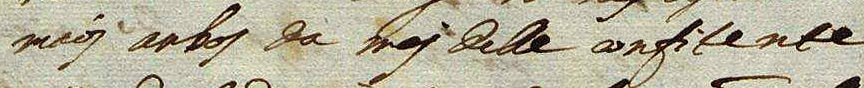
mãos anbos da maj delle confitente
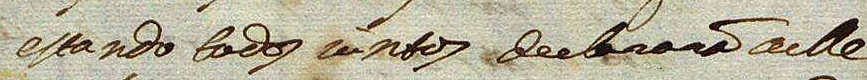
estando todos iuntos declararaõ a elle
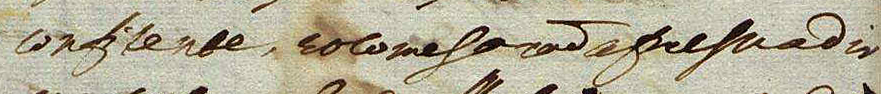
confitente, E o comesaraõ a presuadir
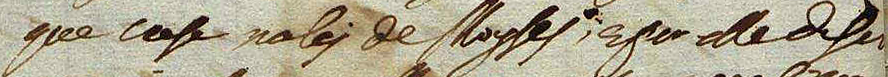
que crese na lej de Moyses; E por elle diser
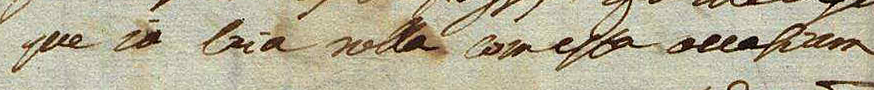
que ia cria nella com esta occasiam
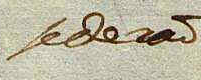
se deraõ
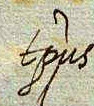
tpūs
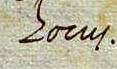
Locus.
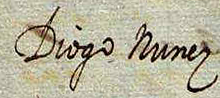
Diogo Nunez
